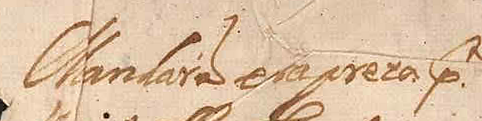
Mandarão e_a preza p.a
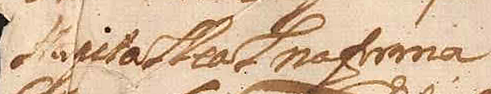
Hospital Real na forma
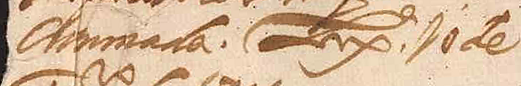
custumada. Lxa. 10 de
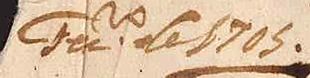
Feu.ro de 1705.
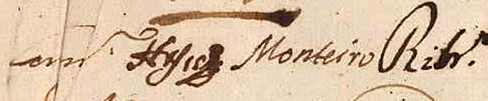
Carnr.o Hasse Monteiro Ribr.o
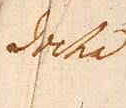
Rocha
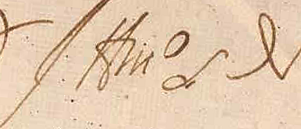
Jllmo Sor
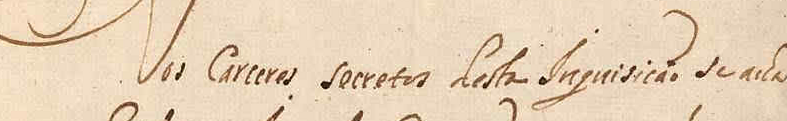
Nos Carceres secretos desta Inquisiçaõ se acha
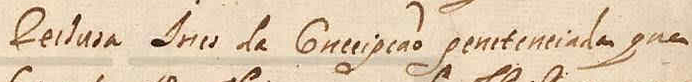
Reclusa Ines da Conceipçaõ penitenciada que
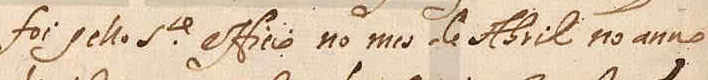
foi pello s.to officio no mes de Abril no anno
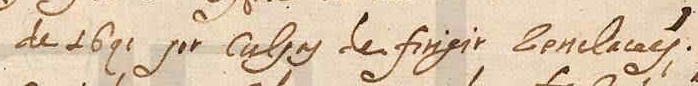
de 1691 por culpas de fingir Reuelaçoẽs;
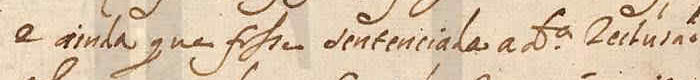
e ainda que fosse sentenciada a d̄.a Reclusaõ
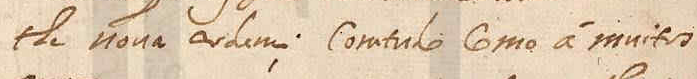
the noua ordem, Comtudo Como á muitos
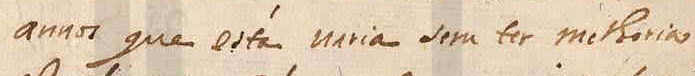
annos que esta uaria sem ter melhoria
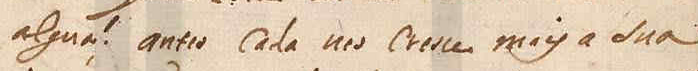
alguā antes cada ues cresce mais a sua
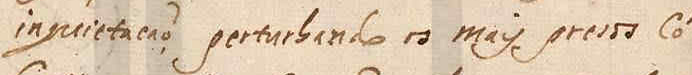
inquietaçaõ, perturbando os mais presos cō
